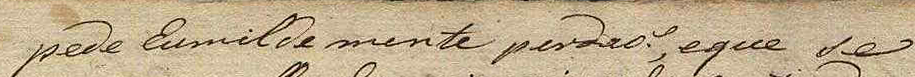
pede humildemente perdaõ, e que se
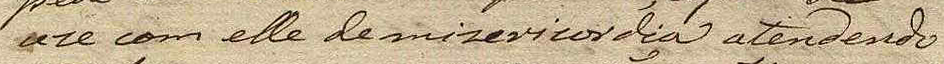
uze com elle de mizericordia atendendo
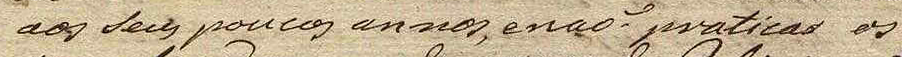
aos seus poucos annos, e naõ praticao os
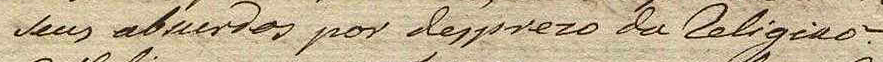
seus absurdos por desprezo da Religiaõ
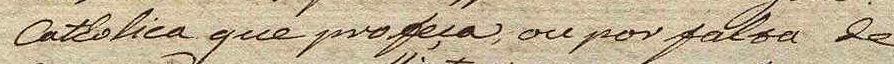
Catholica que profeça, ou por falta de
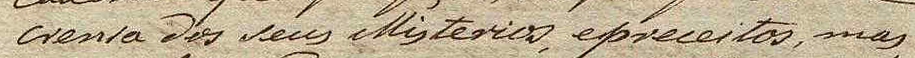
crensa dos seus Misterios, e preceitos, mas
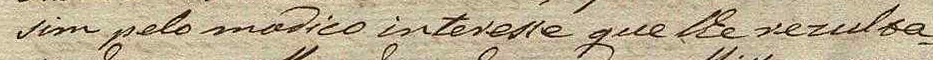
sim pelo modico interesse que lhe rezulta
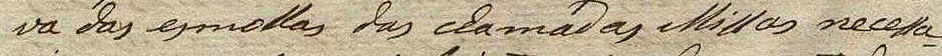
va das esmollas das chamadas Missas necessa
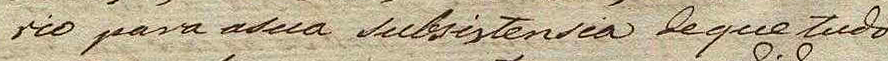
rio para a sua subsistensia de que tudo
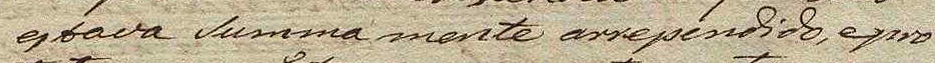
estava summamente arrependido, e pro
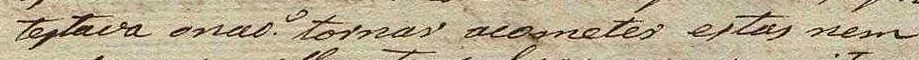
testava o naõ tornar a cometer estas nem
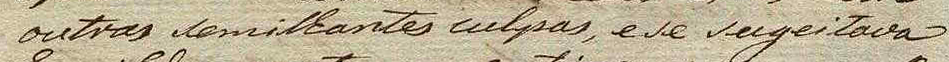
outras semilhantes culpas, e se sugeitava
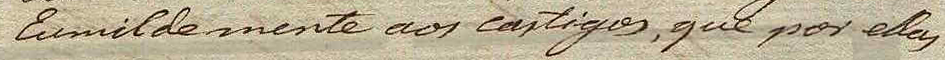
humildemente aos castigos, que por ellas
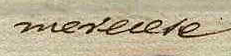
merecese
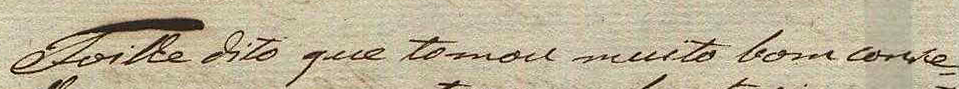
Foilhe dito que tomou muito bom conse
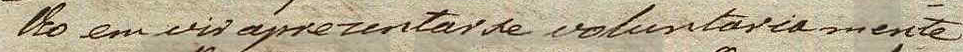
lho em vir aprezentarse voluntariamente
